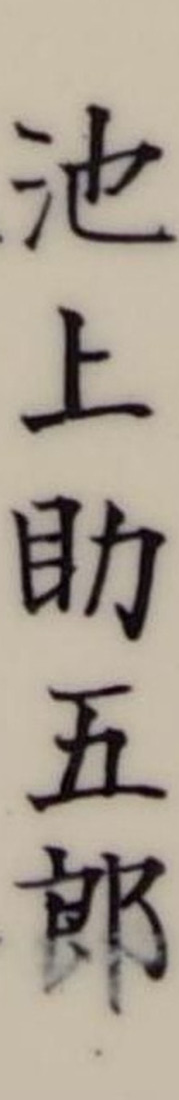池上助五郎
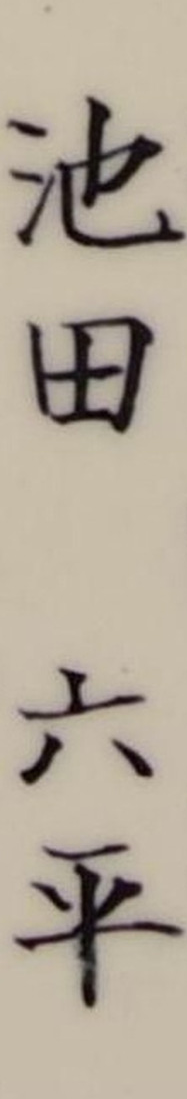池田六平
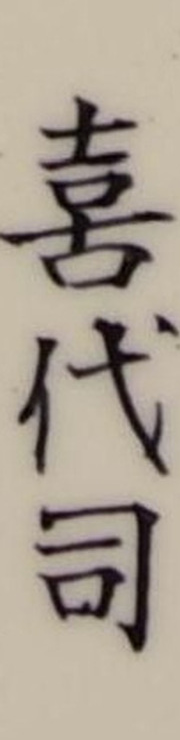喜代司
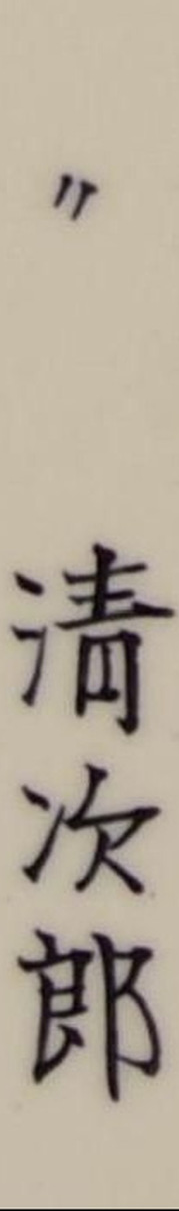清次郎
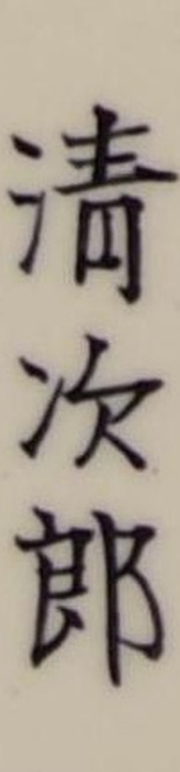清次郎
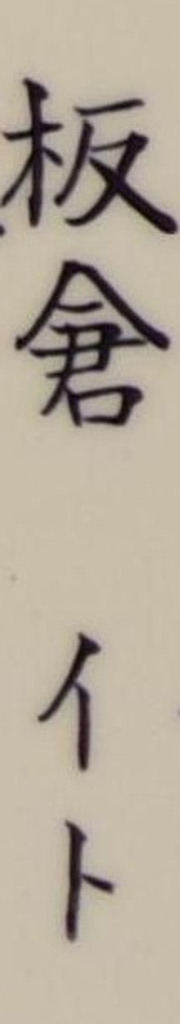板倉イト
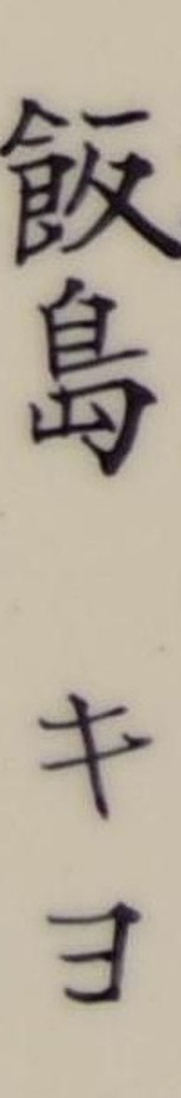飯島キヨ
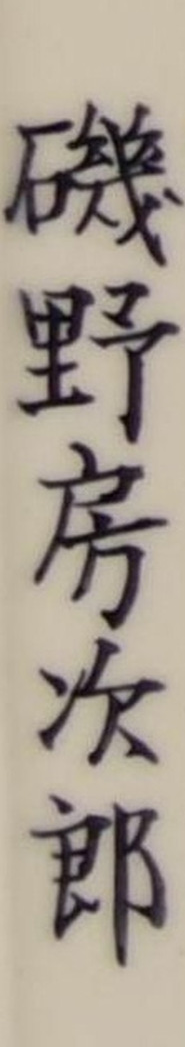磯野房次郎

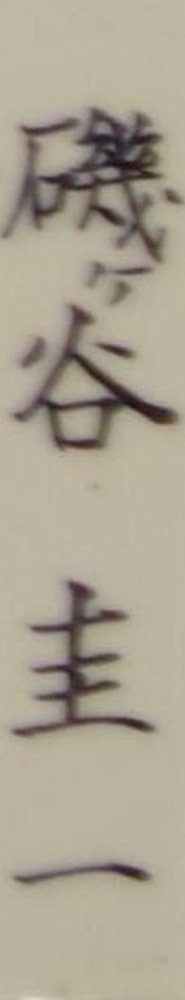磯ヶ谷圭一
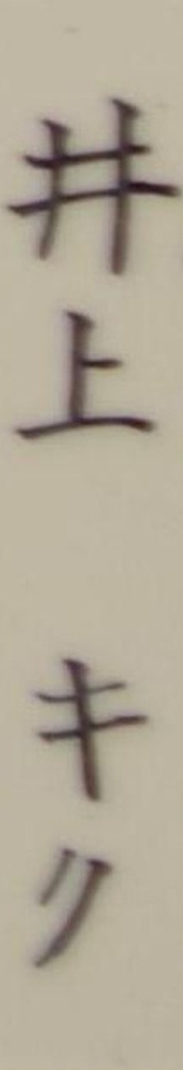井上キク
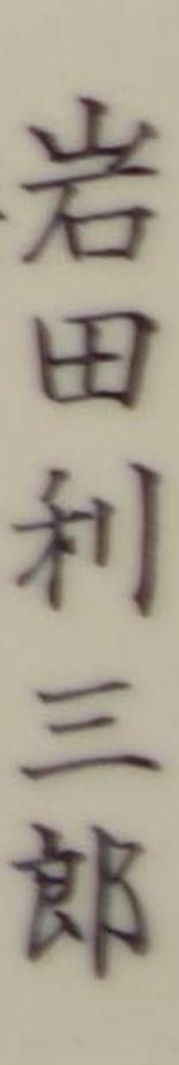岩田利三郎
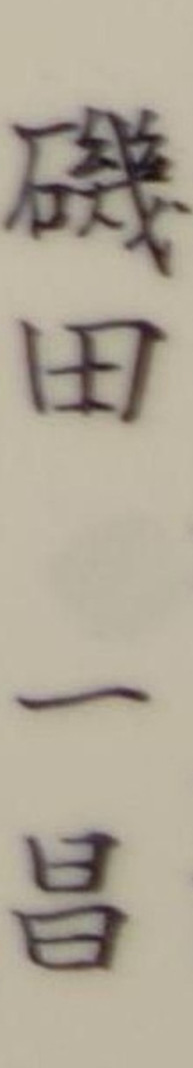磯田一昌
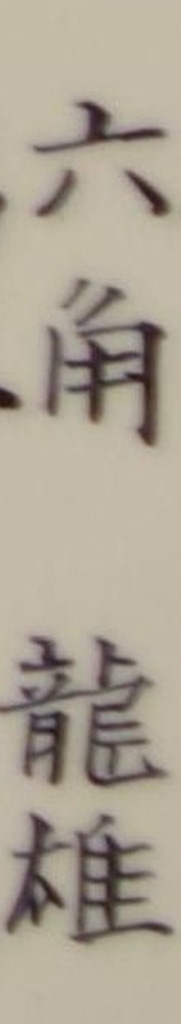六角龍雄
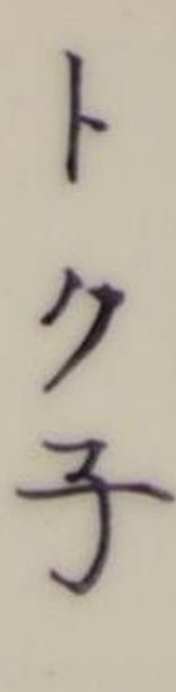トク子
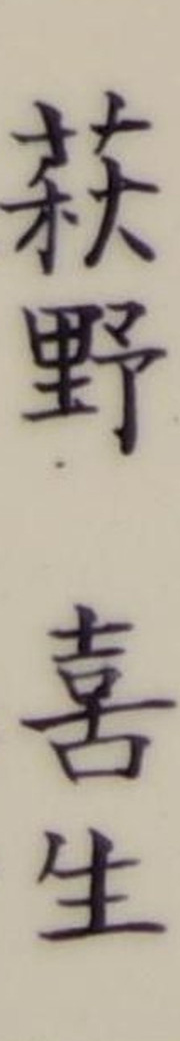萩野喜生

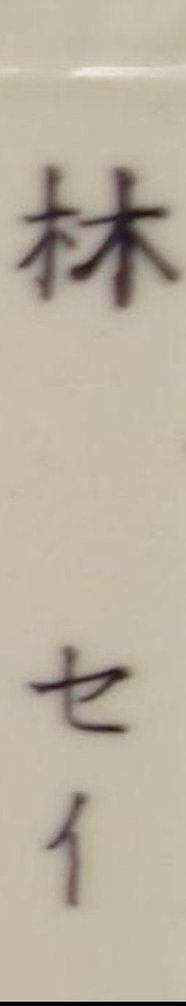林セイ
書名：M~S
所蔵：高野山金剛峯寺
